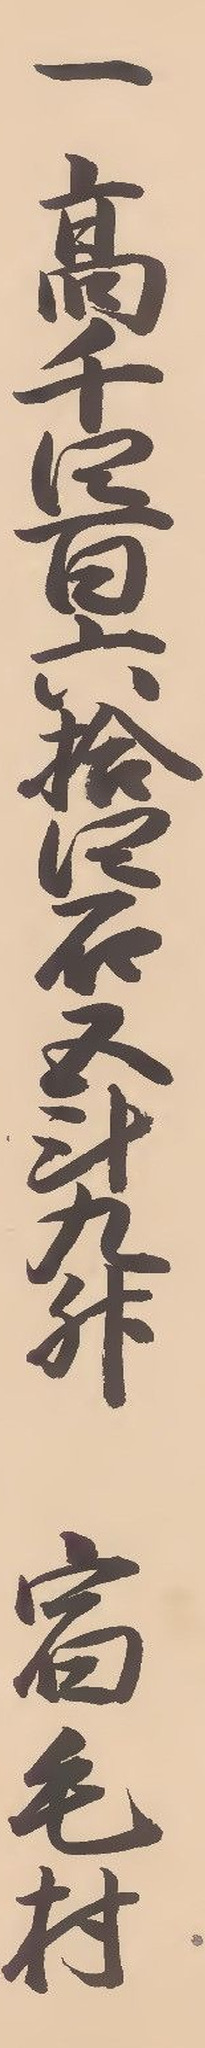一高千四百六拾四石五斗九升宿毛村
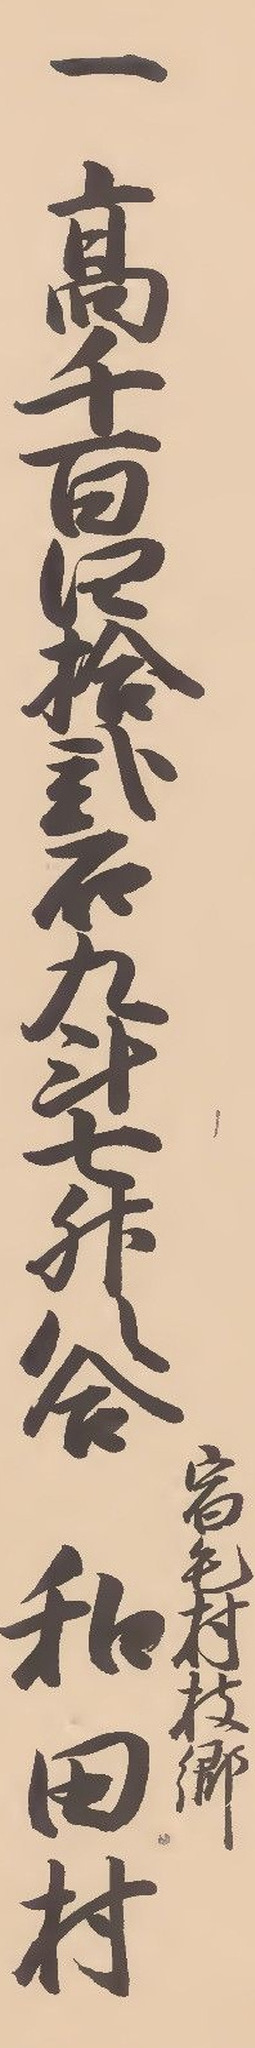一高千百四拾弐石九斗七升八合和田村
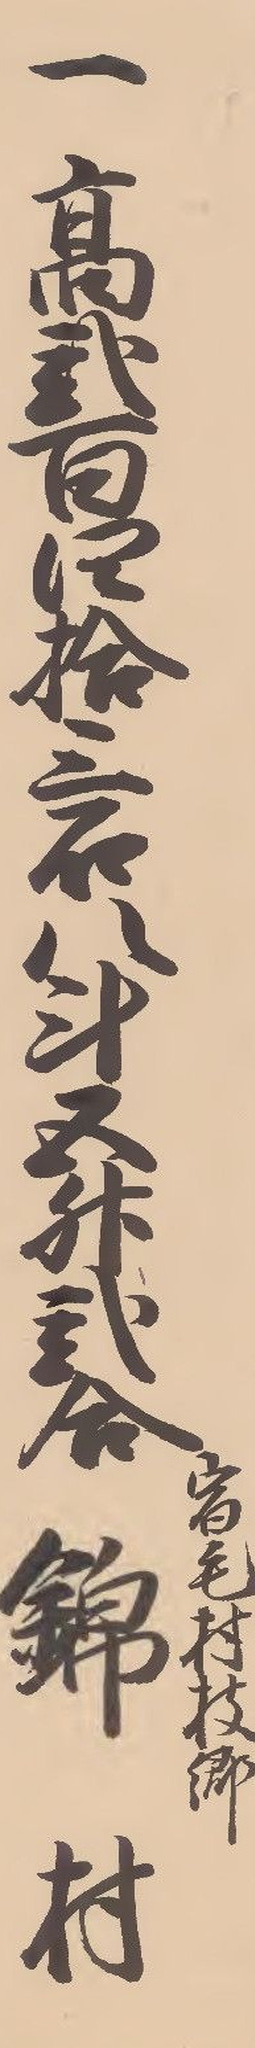一高弐百四拾三石八斗五升弐合錦村
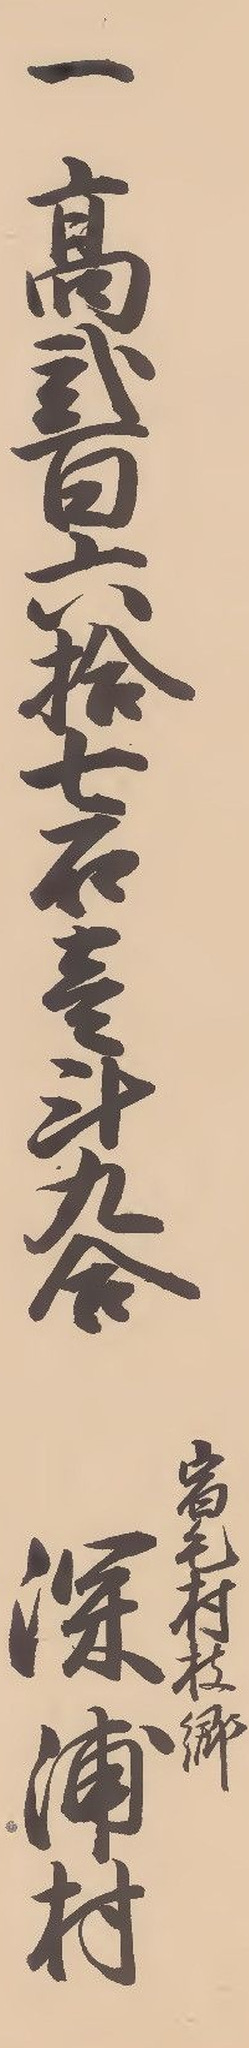一高弐百六拾七石壱斗九合深浦村
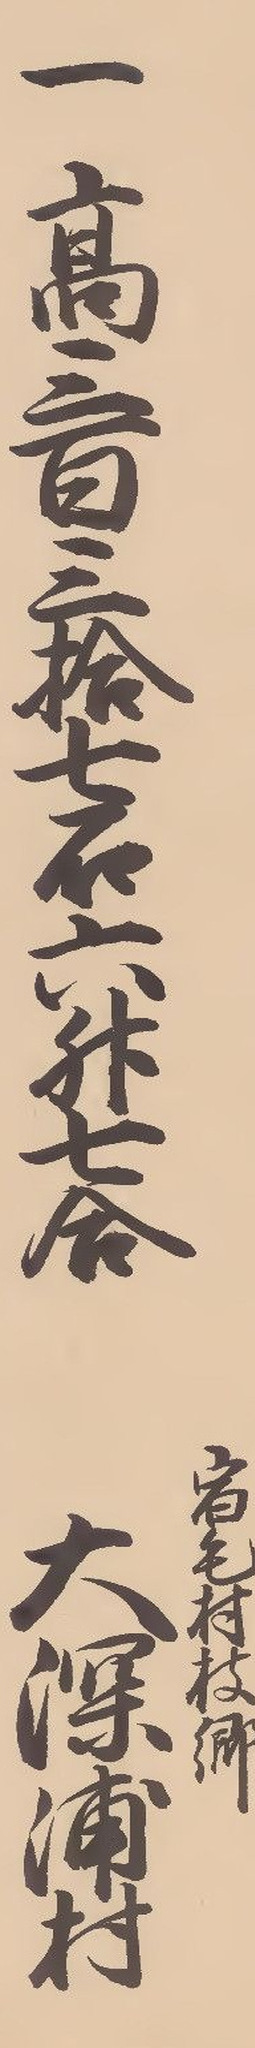一高三百三拾七石六斗七合大深浦村
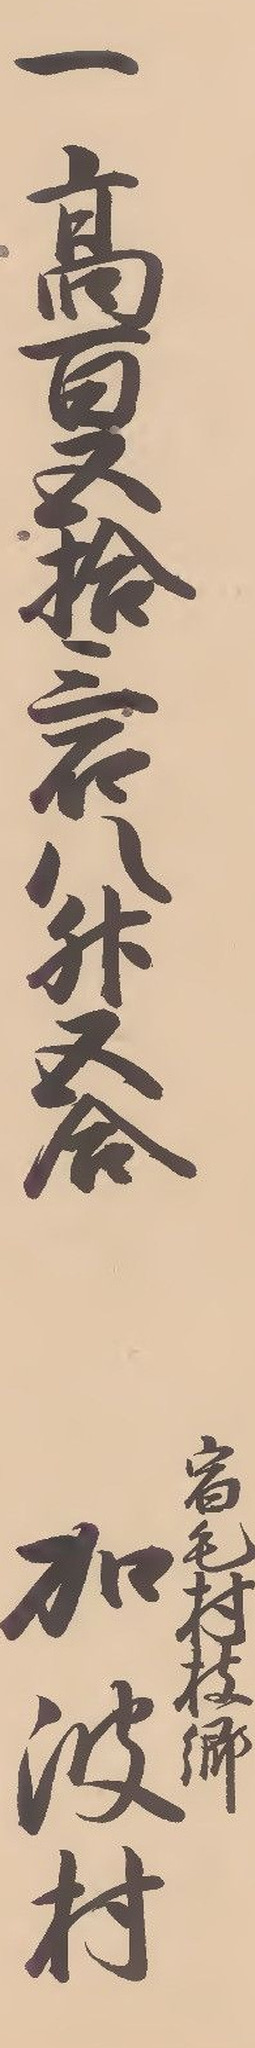一高百五拾三石八升五合加波村

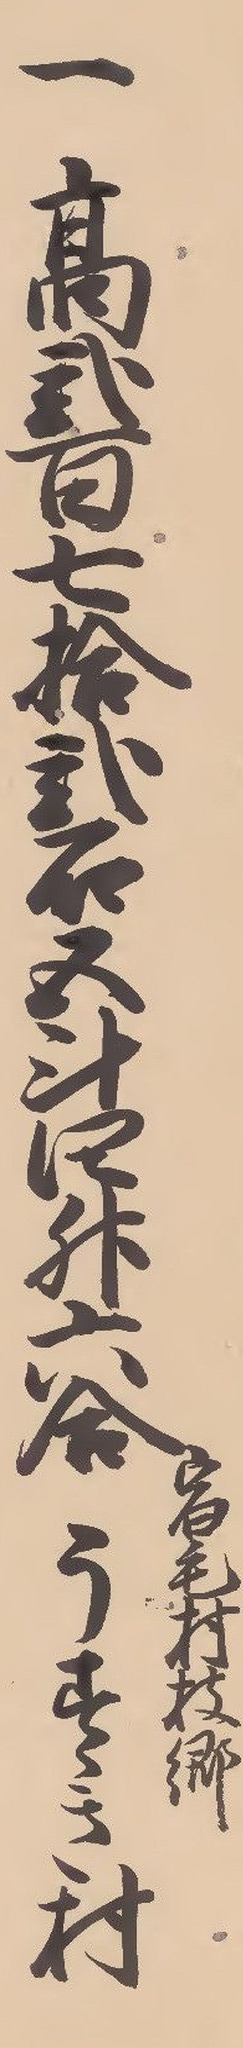一髙弐百七拾弐石五斗四升六合うすゝき村
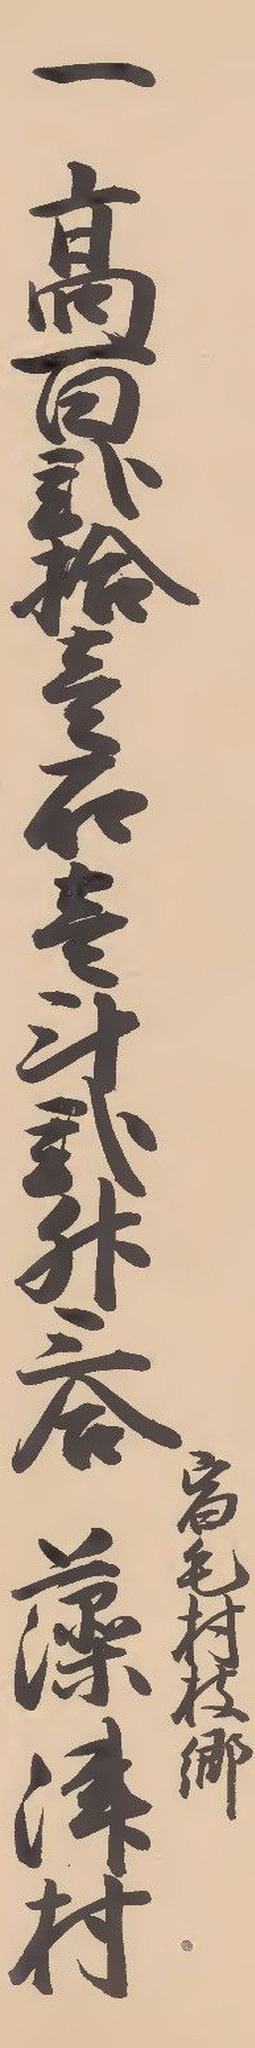一髙百弐拾壱石壱斗弐升三合藻津村
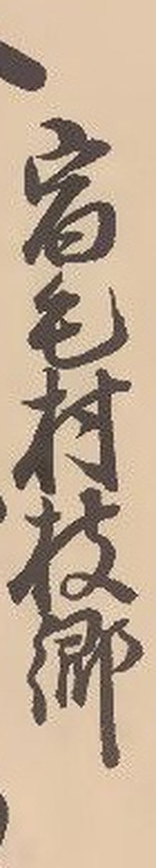宿毛村枝郷
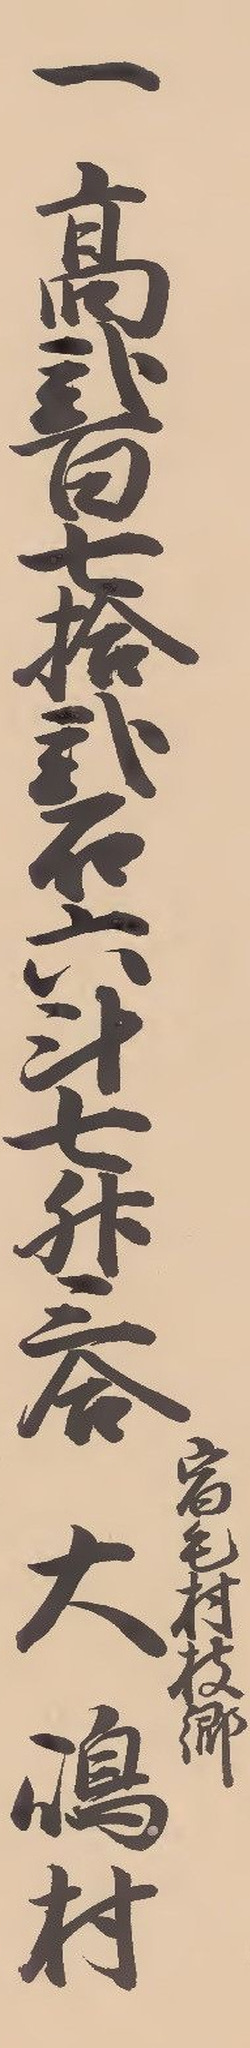一髙弐百七拾弐石六斗七升三合大嶋村
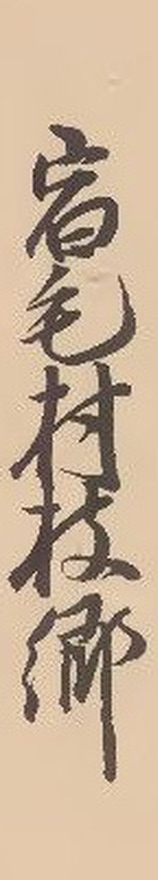宿毛村枝郷
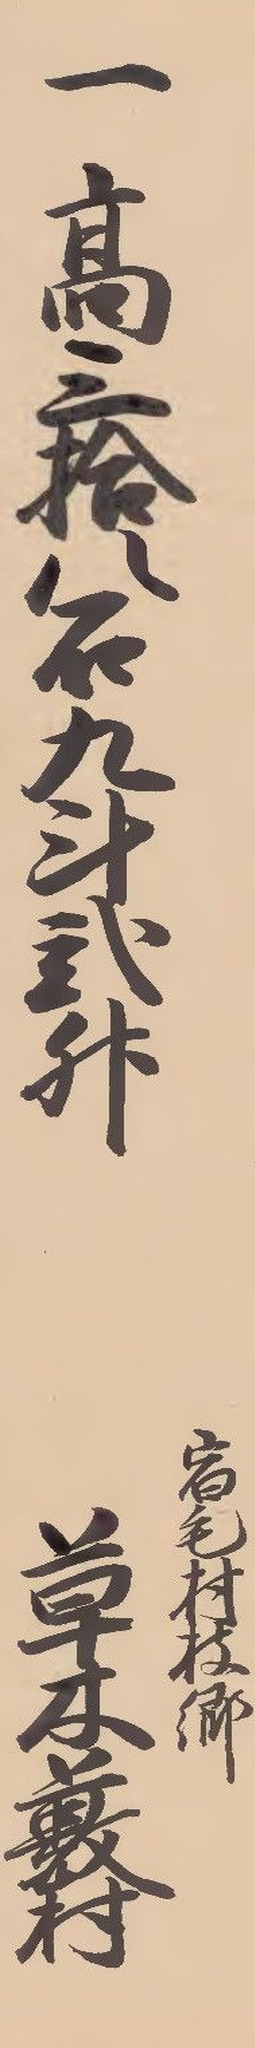一髙三拾八石九斗弐升草木藪村
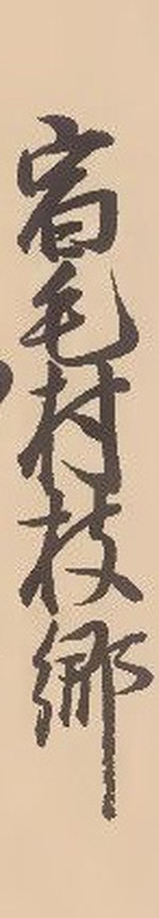宿毛村枝郷
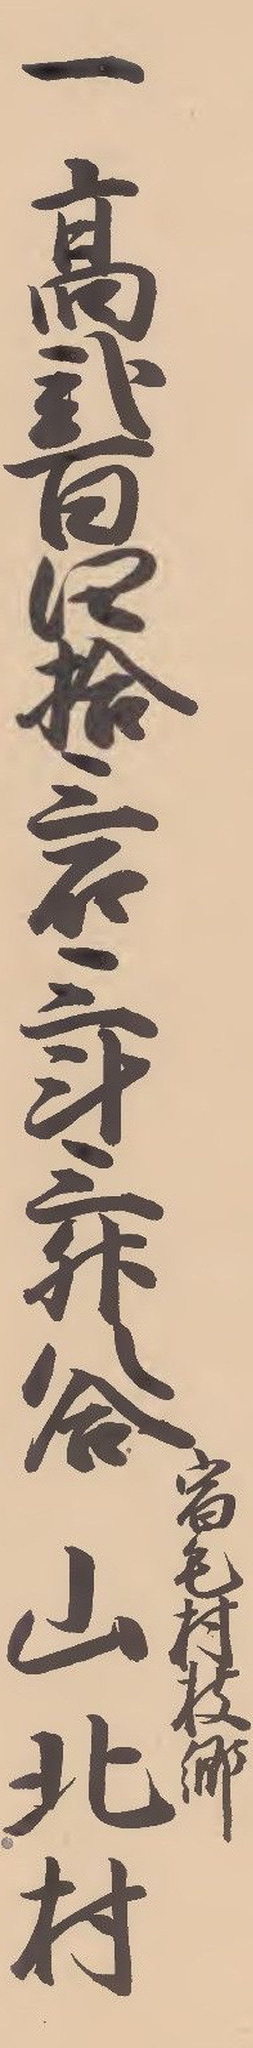一髙弐百四拾三石三斗三升八合山北村
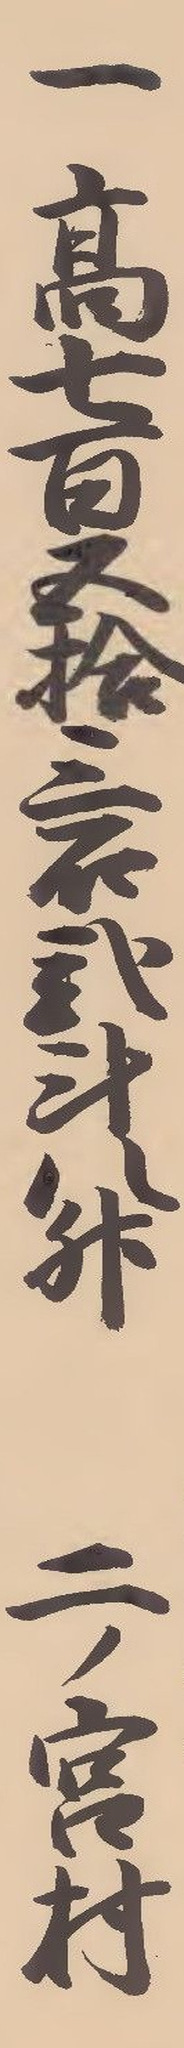一髙七百五拾三石弐斗八升二ノ宮村
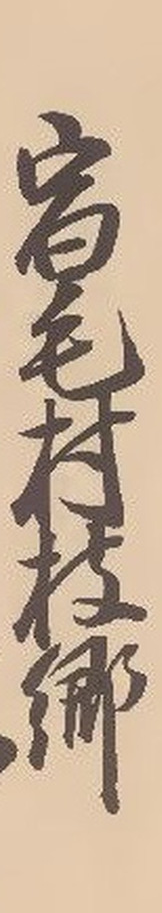宿毛村枝郷
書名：土佐国郷帳
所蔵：国立公文書館 National Archives of Japan
